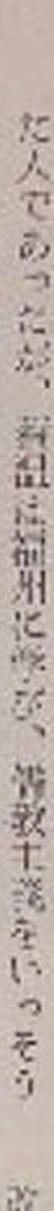た人であったが、蔡温は福州に学び、儒教主義をいっそう
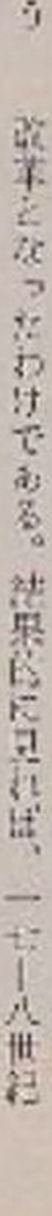改革となったわけである。結果的に見れば、一七―八世紀
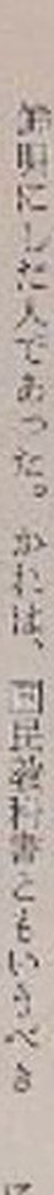明にした人であった。かれは、国民教科書ともいうべき
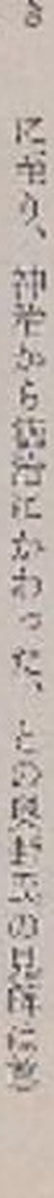に至り、神治から徳治にかわった、との奥野氏の見解は尊
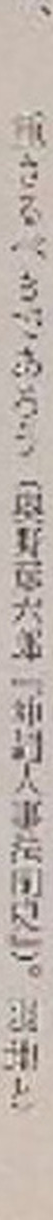重さるべきであろう(奥野彦六郎『沖縄人事法制史』)。羽地と
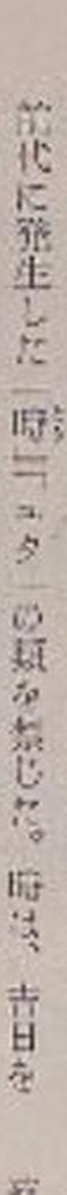前代に発生した「時」「ユタ」の類を禁じた。時は、吉日を
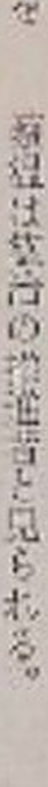蔡温は徳治の推進者と見られる。
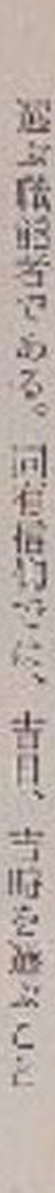選ぶ職能者である。固有信仰では、吉日は、吉時を選ぶこと
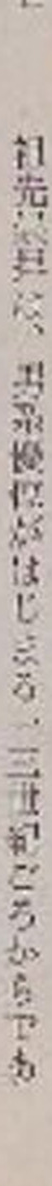祖先崇拝は、男系優位がはじまる一三世紀ごろからであ
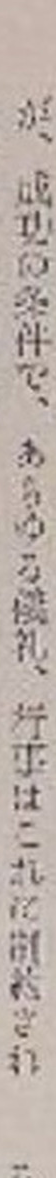が、成功の条件で、あらゆる儀礼、行事はこれに約され
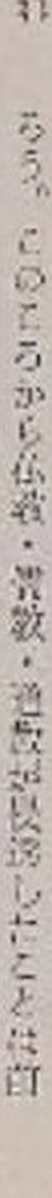ろう。このころから仏教・儒教・教が浸透したことは前
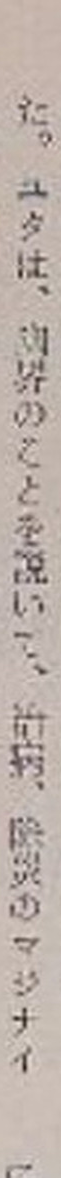た。ユタは、幽界のことを説いて、治病、除災のマジナイ
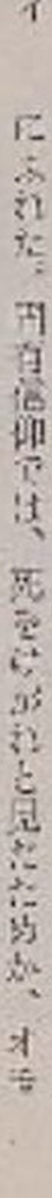にふれた。固有信仰では、死をけがれと見たためか、オモ
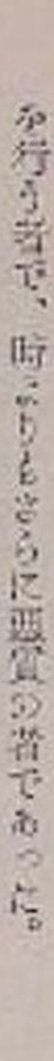を行う者で、時よりもさらに悪質の者であった。
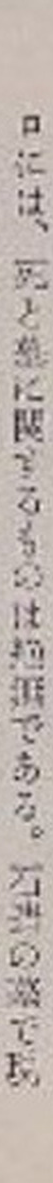ロには、死と墓に関するものは絶無である。石造の墓で現
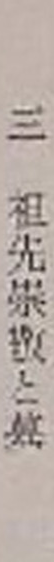三祖先崇敬と墓
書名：沖縄固有信仰のおとろえ
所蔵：University of the Ryukyus Library
